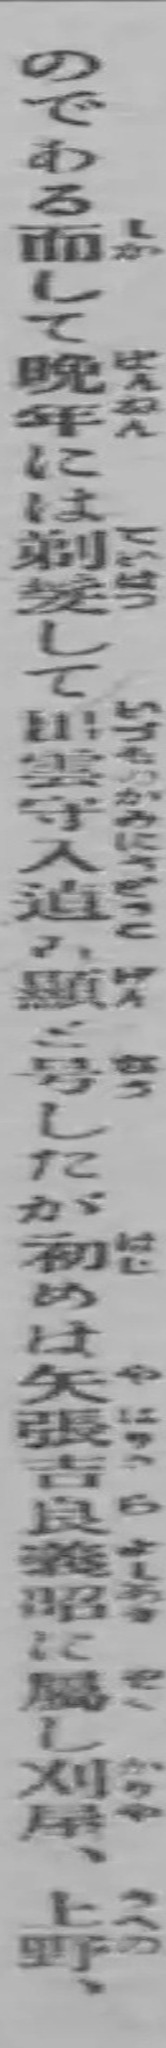のである而して晩年には剃髪して出雲守入道古顕と号したが初めは矢張吉良義昭に属し刈屋、上野、
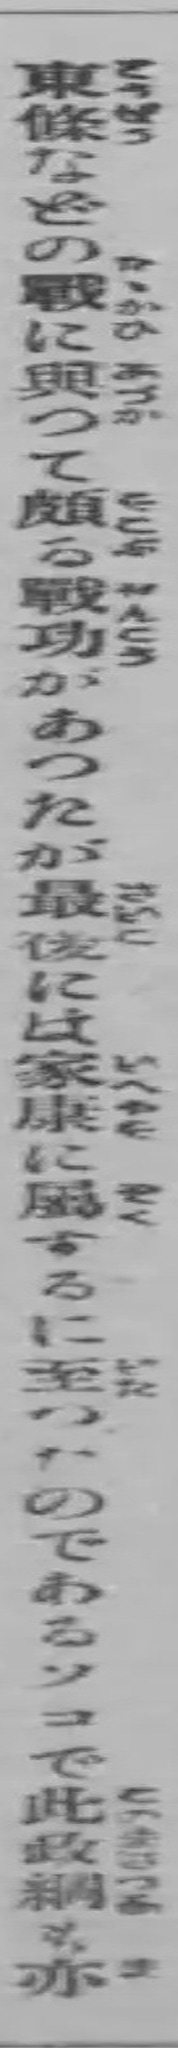東條などの戦に与つて頗る戦功があつたが最後には家康に属するに至つたのであるソコで此政綱も亦
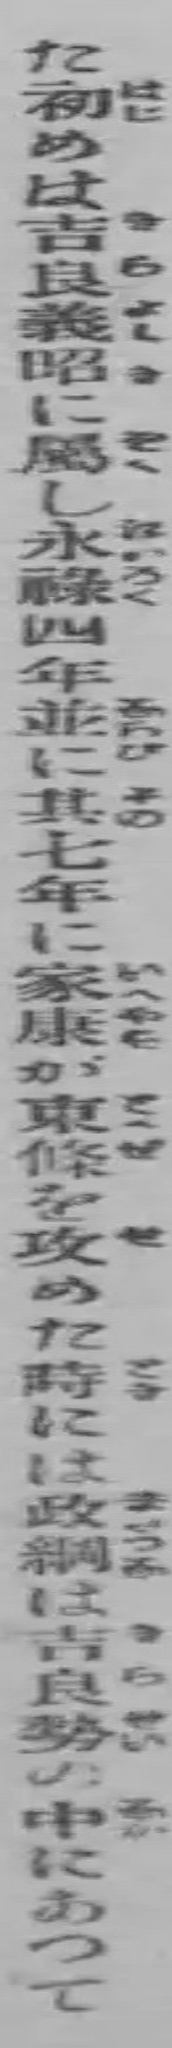た初めは吉良義昭に属し永禄四年並に其七年に家康が東條を攻めた時には政綱は吉良勢の中にあつて
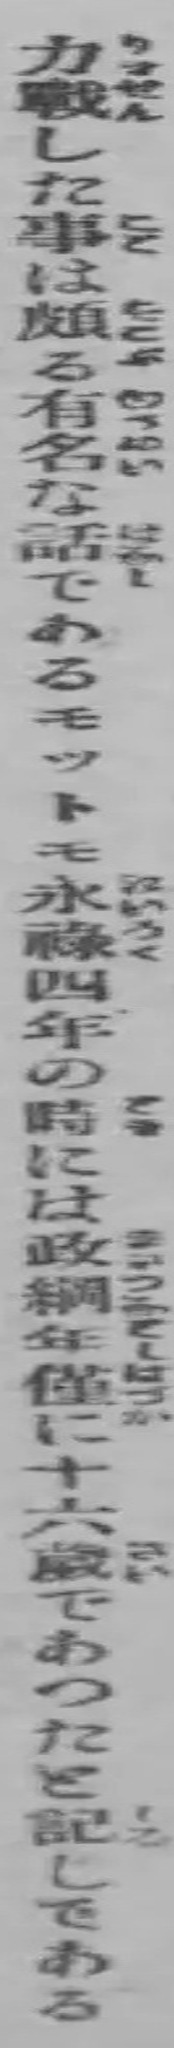力戦した事は頗る有名な話であるモツトモ永禄四年の時には政綱年僅に十六歳であつたと記してある
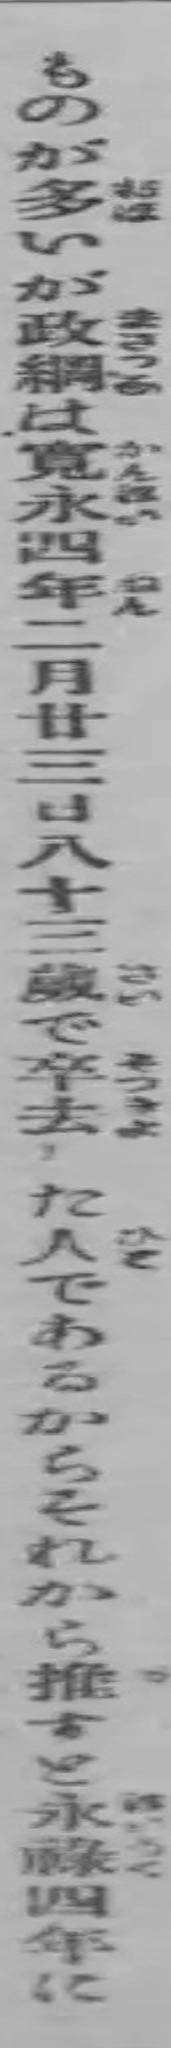ものが多いが政綱は寛永四年二月廿三日八十三歳で卒去した人であるからそれから推すと永禄四年に
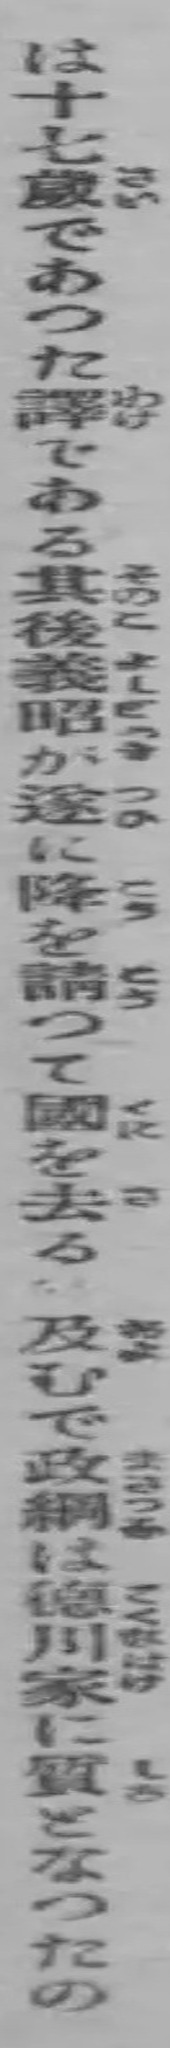は十七歳であつた訳である其後義昭が遂に降を請つて国を去るに及むで政綱は徳川家に質となつたの

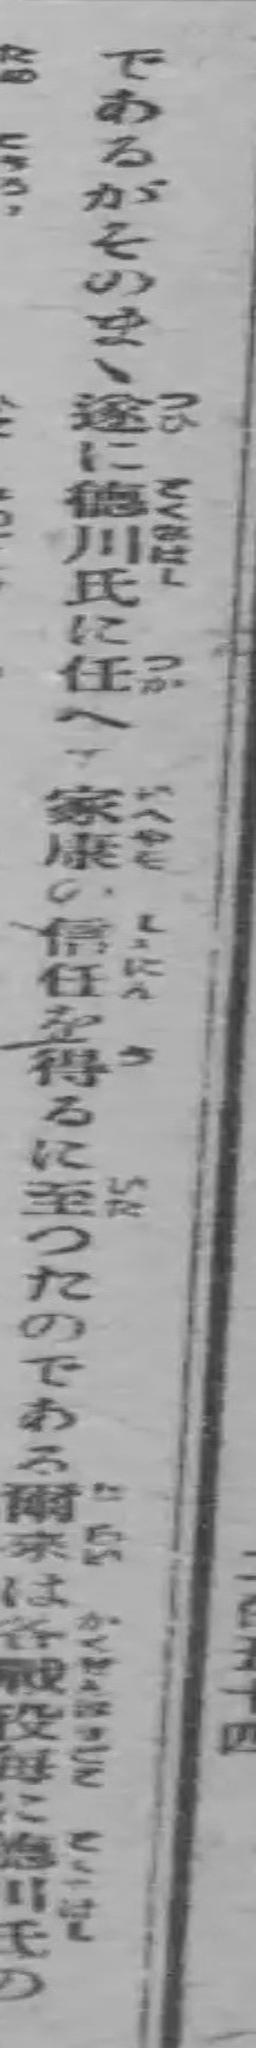であるがそのまゝ遂に徳川氏に任へて家康の信任を得るに至つたのである爾来は各戦役毎に徳川氏の
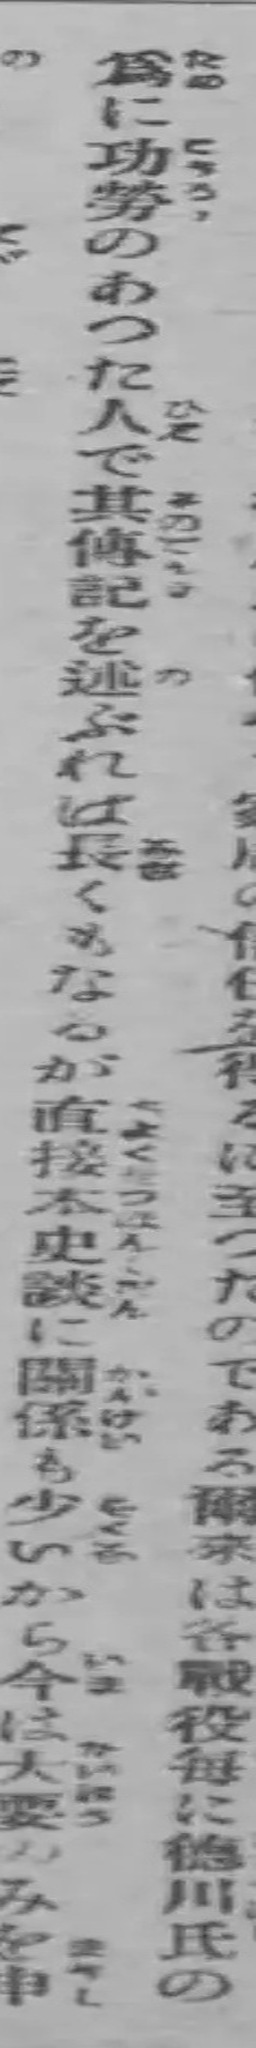為に功労のあつた人で其伝記を述ぶれば長くもなるが直接本史談に関係も少いから今は大要のみを申
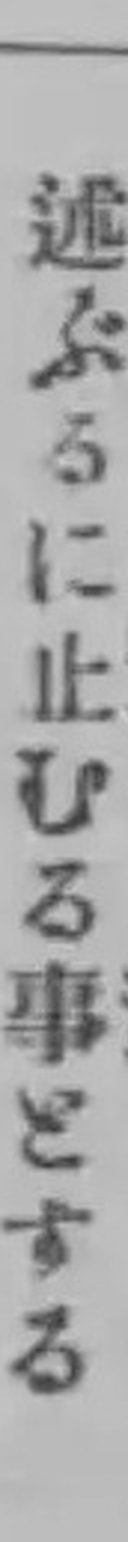述ぶるに止むる事とする
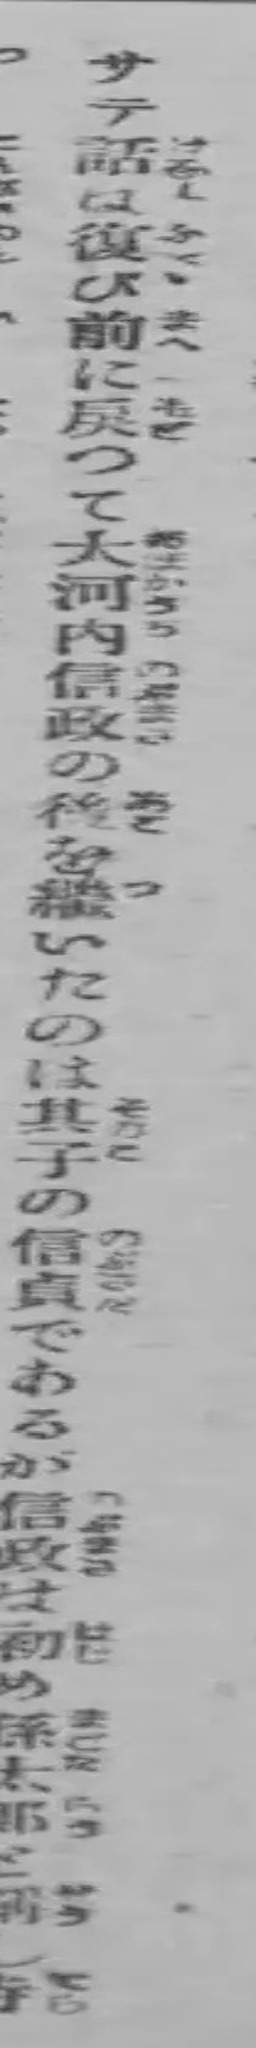大河内信貞サテ話は復び前に戻つて大河内信政の後を継いだのは其子の信貞であるが信政は初め孫太郎と称し寺
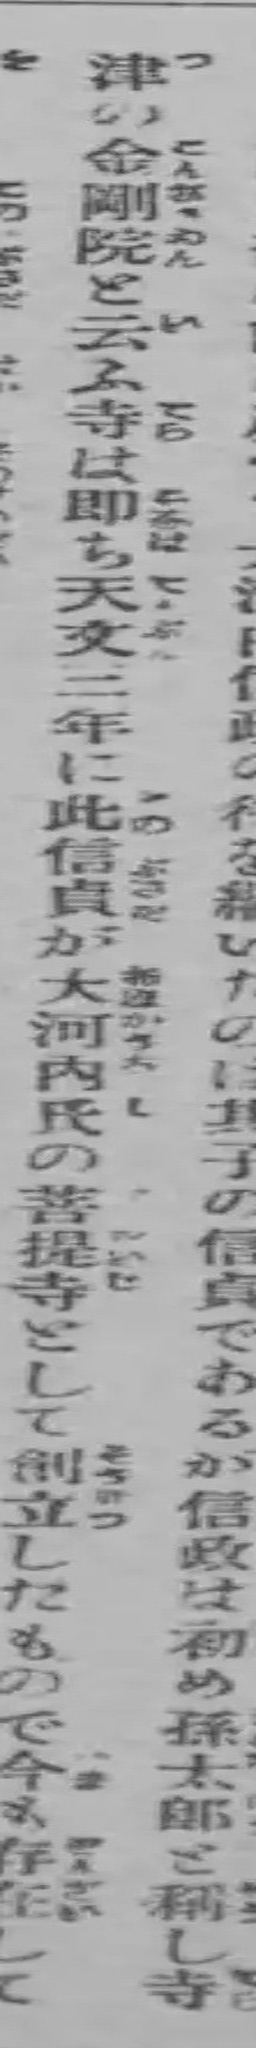金剛院津の金剛院と云ふ寺は即ち天文二年に此信貞が大河内氏の菩提寺として創立したもので今も存在して
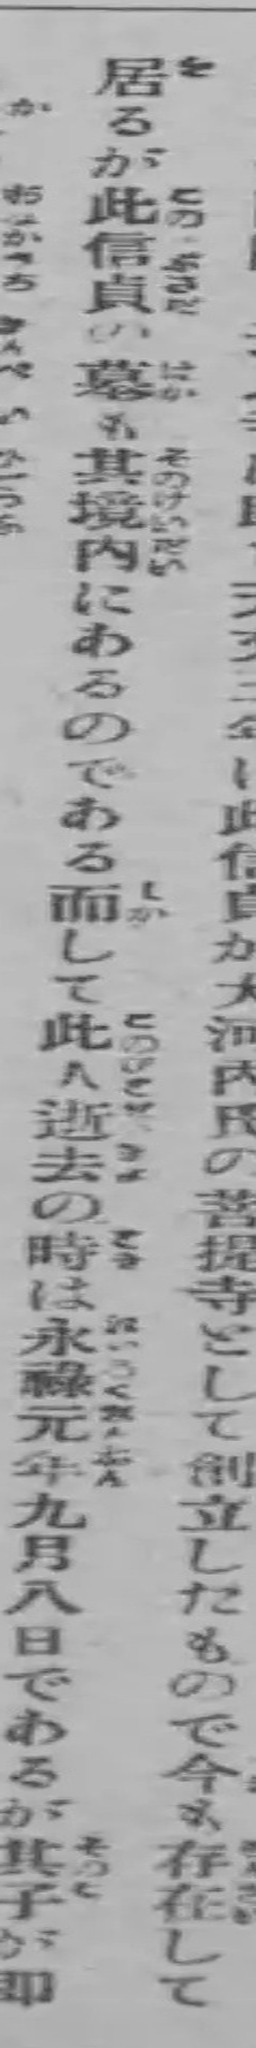居るが此信貞の墓も其境内にあるのである而して此人逝去の時は永禄元年九月八日であるが其子が即
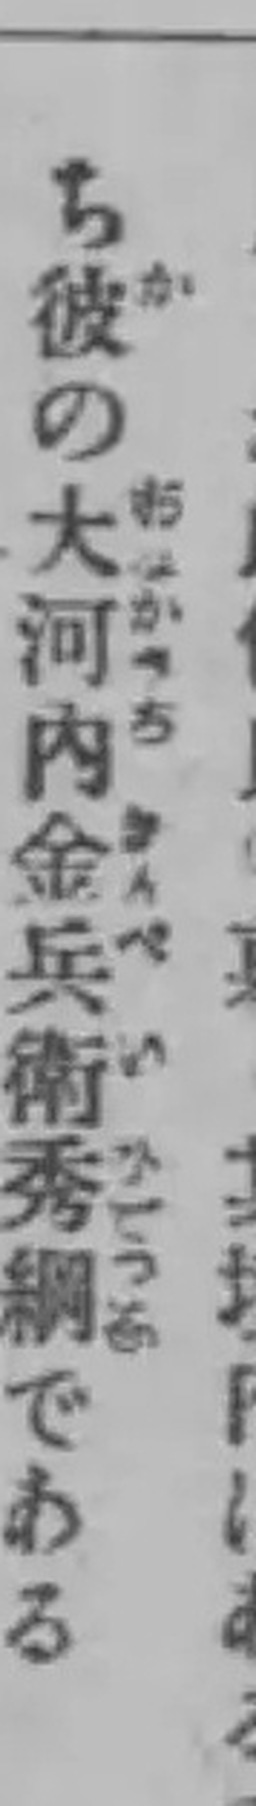ち彼の大河内金兵衛秀綱である
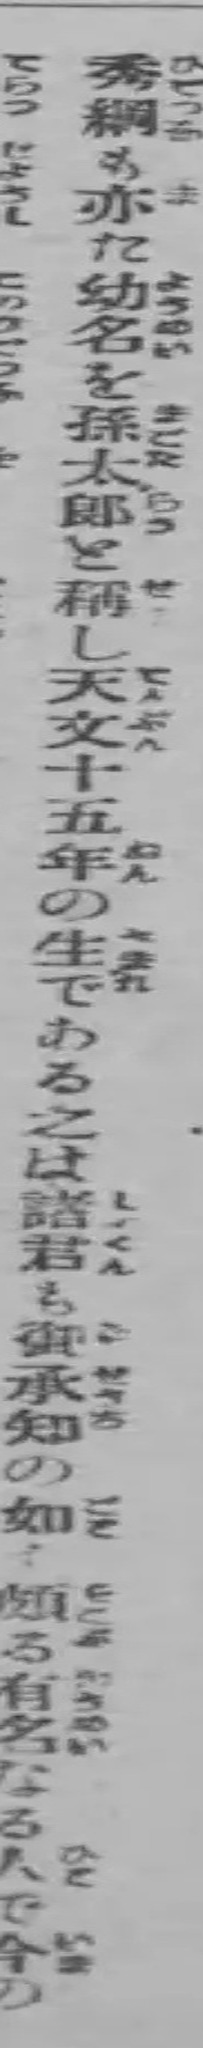大河内秀綱秀綱も亦た幼名を孫太郎と称し天文十五年の生である之は諸君も御承知の如く頗る有名なる人で今の
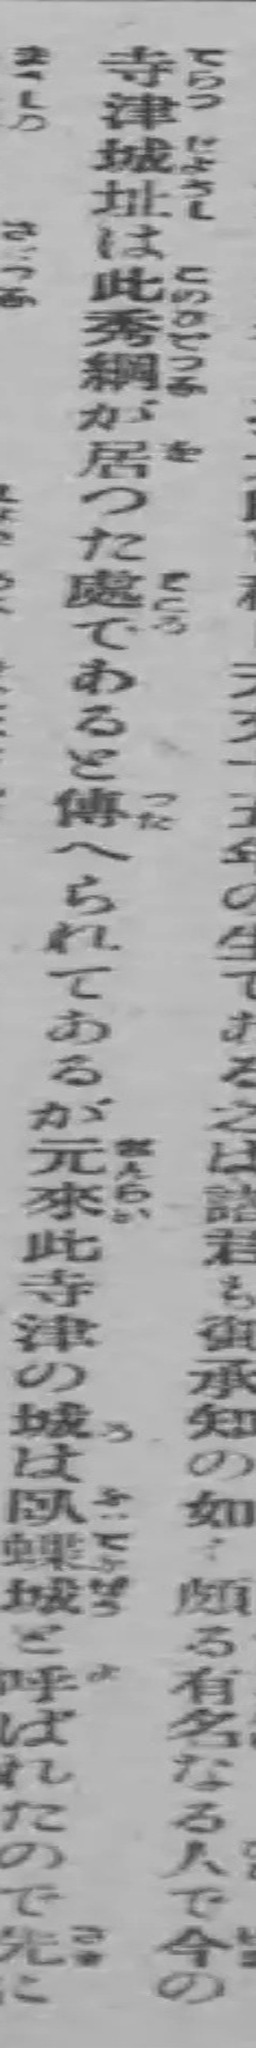臥蝶城寺津城址は此秀綱が居つた処であると伝へられてあるが元来此寺津の城は臥蝶城と呼ばれたので先に
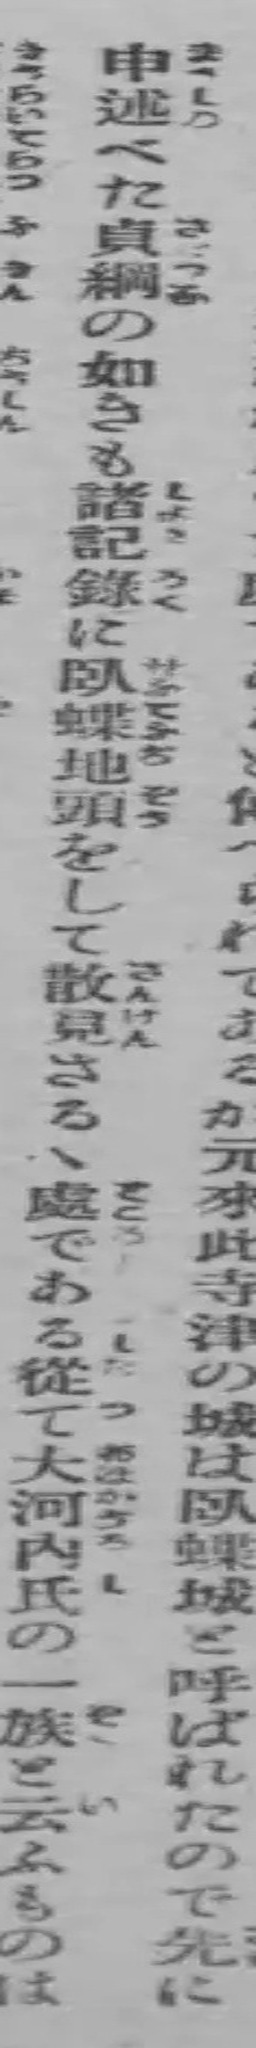申述べた貞綱の如きも諸記録に臥蝶地頭をして散見さるゝ処である従て大河内氏の一族と云ふものは
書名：豊橋市史談
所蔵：国立国会図書館 National Diet Library, JAPAN
